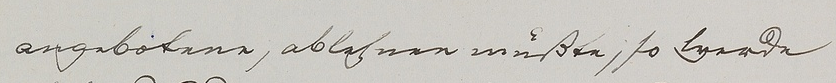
angebotene, ablehnen müßte, so werde
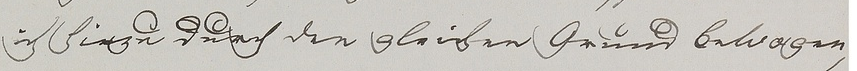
ich hiezu durch den gleichen Grund bewogen,
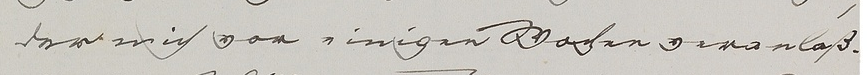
der mich vor einigen Wochen veranlaß-
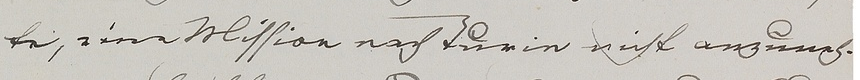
te, eine Mission nach Turin nicht anzuneh-
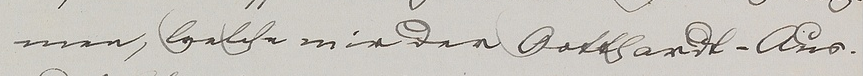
men, welche mir der Gotthardt-Aus-
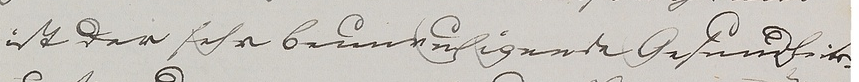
ist der sehr beunruhigende Gesundheits-
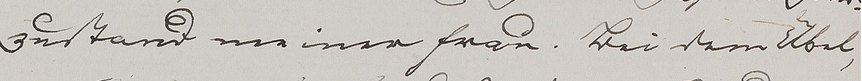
zustand meiner Frau. Bei dem Übel,
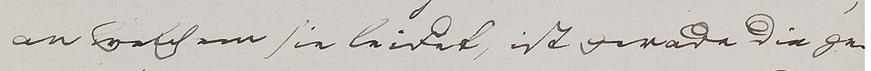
an welchem sie leidet, ist gerade die ge-
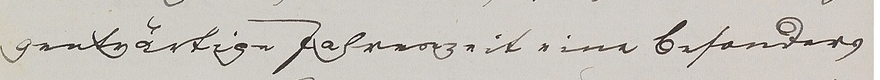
genwärtige Jahreszeit eine besonders
